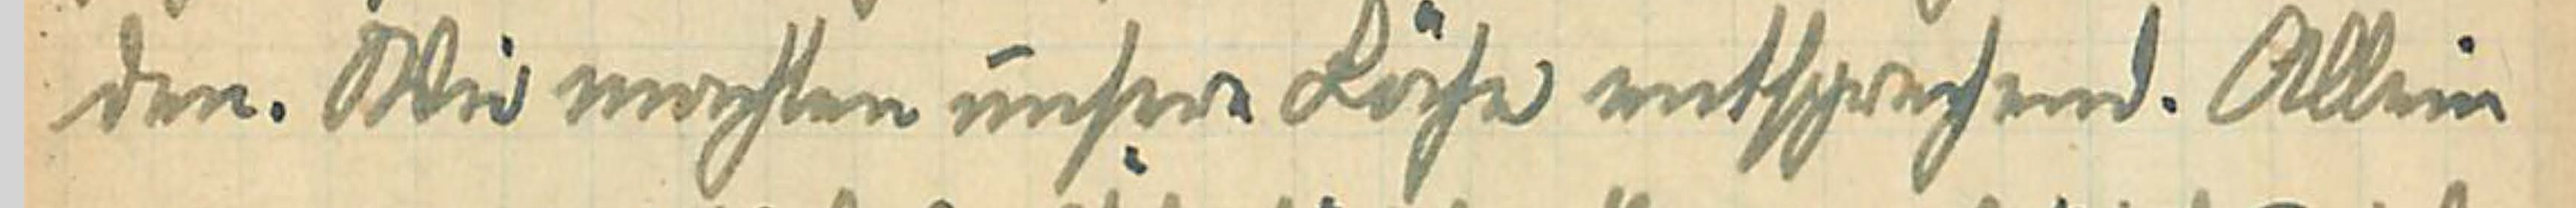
den. Wir machten unsere Löcher entsprechend. Allein
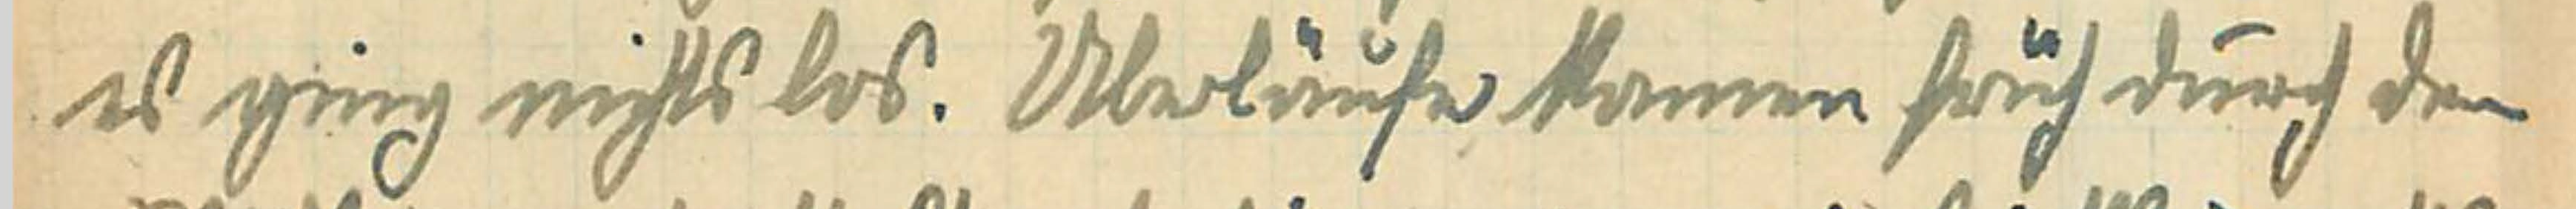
es ging nichts los. Überläufer kamen früh durch den
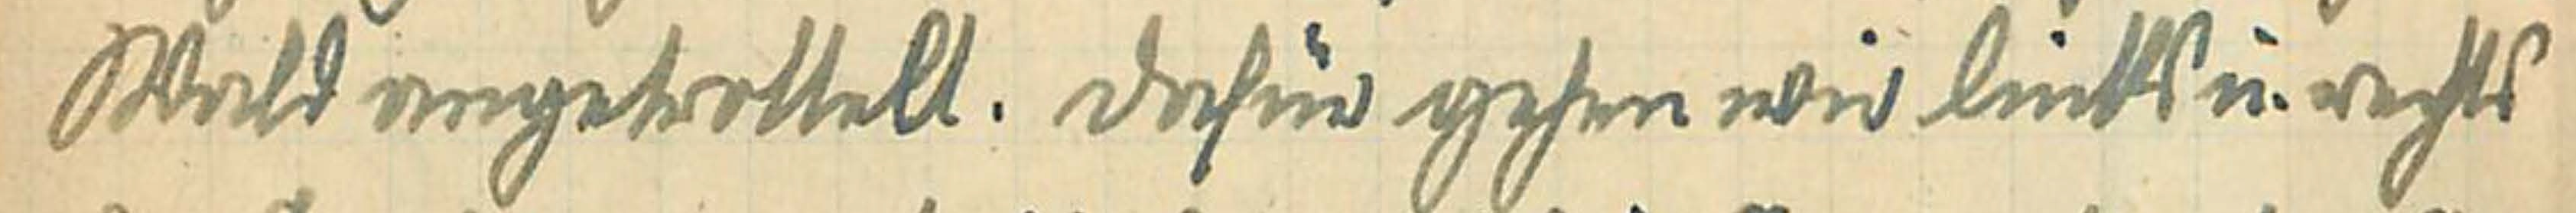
Wald angetrottelt. Dafür gehen wir links u. rechts
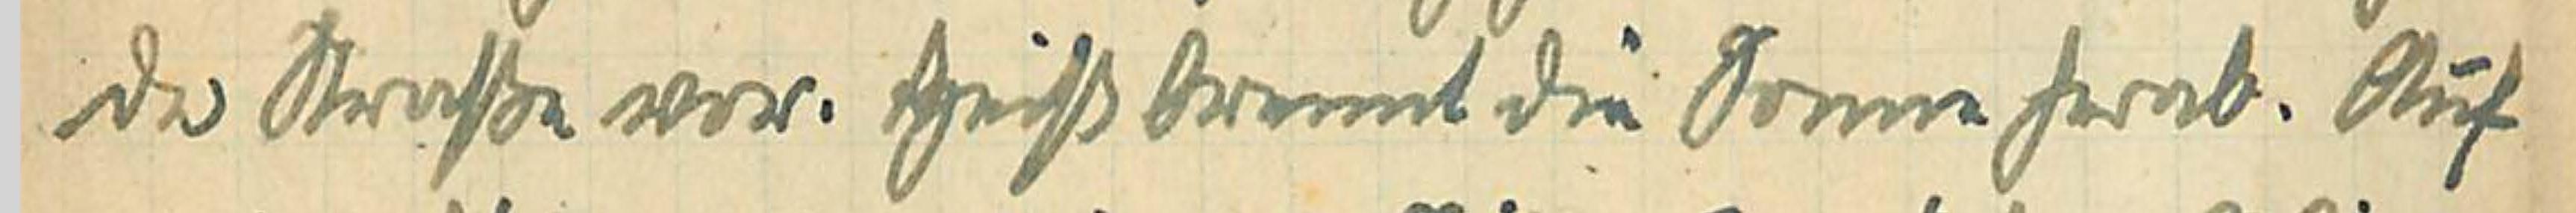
der Straße vor. Heiß brennt die Sonne herab. Auf
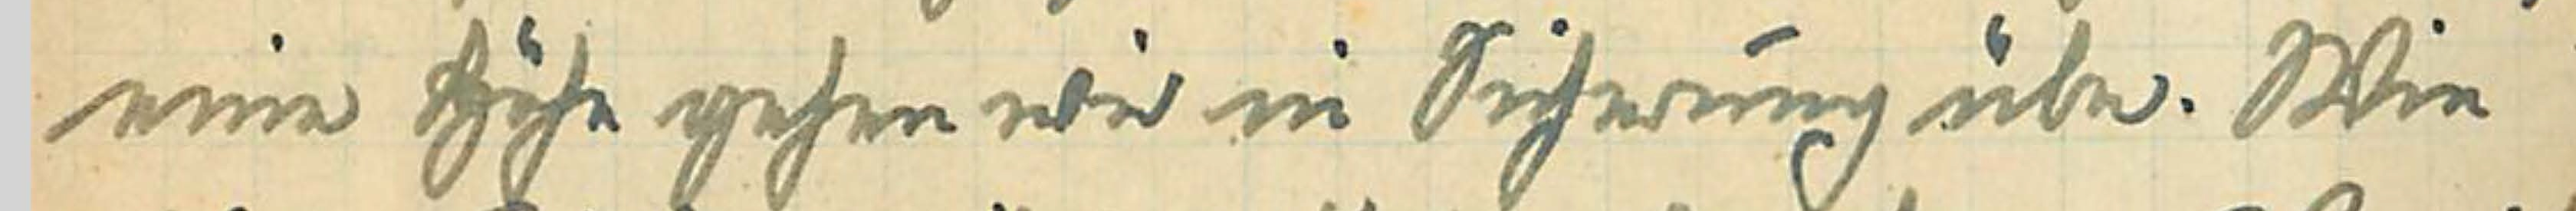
einer Höhe gehen wir in Sicherung über. Wie
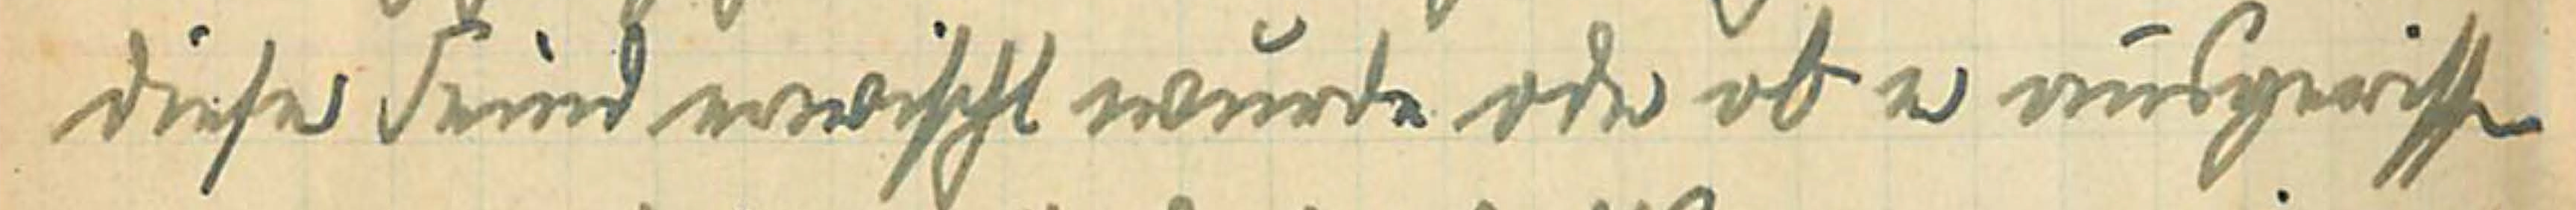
dieser Feind erwischt wurde oder ob er ausgerissen
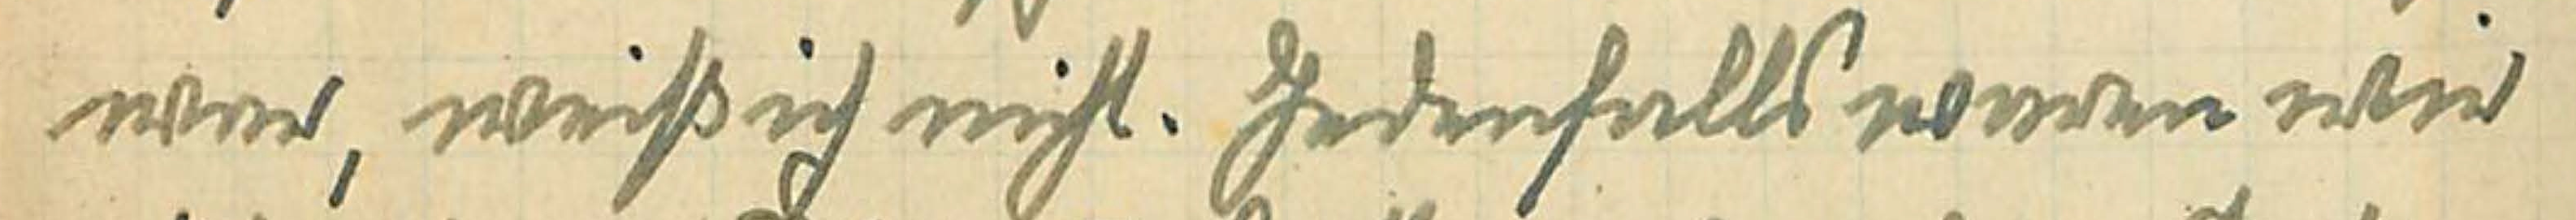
war, weiß ich nicht. Jedenfalls waren wir
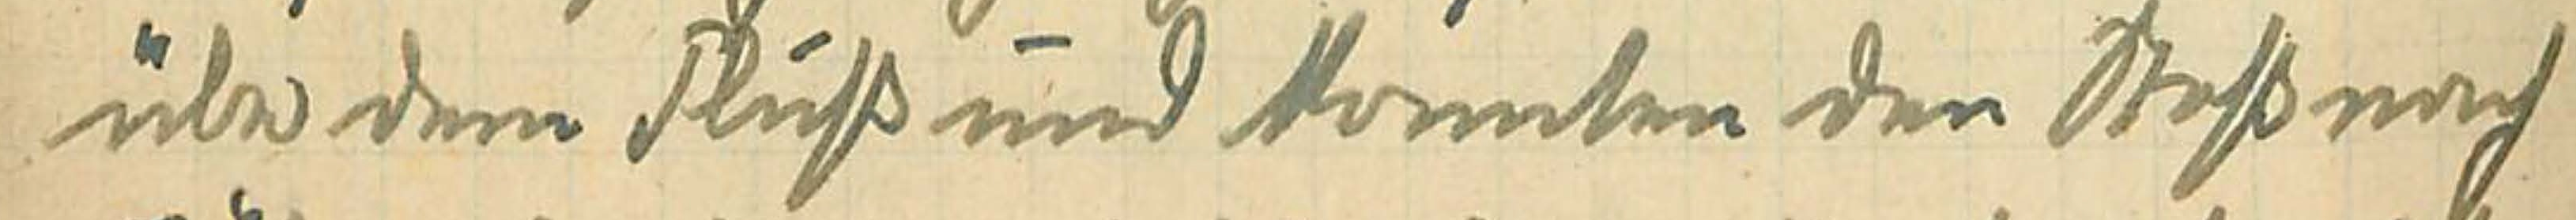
über dem Fluß und konnten den Stoß nach
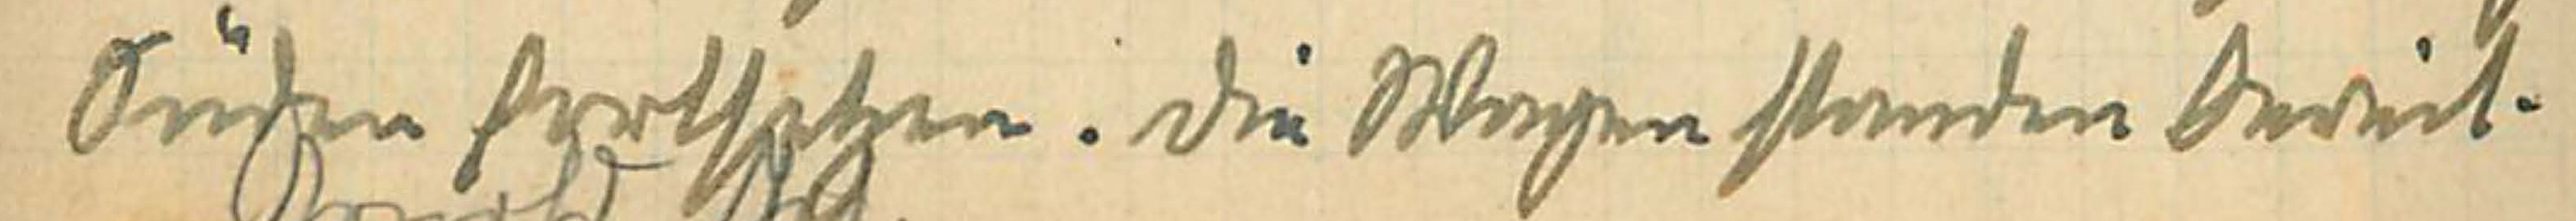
Süden fortsetzen. Die Wagen standen bereit.
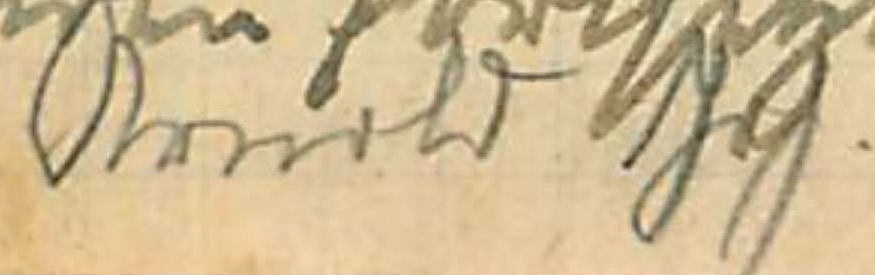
Arnold Joh.
